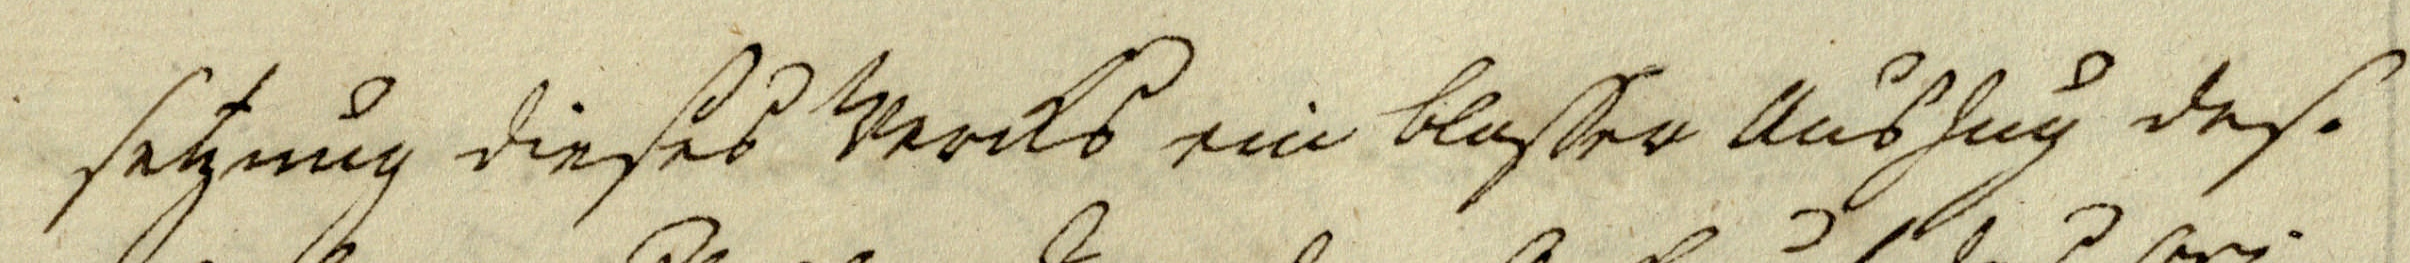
setzung dieses Wercks ein blasser Auszug des¬
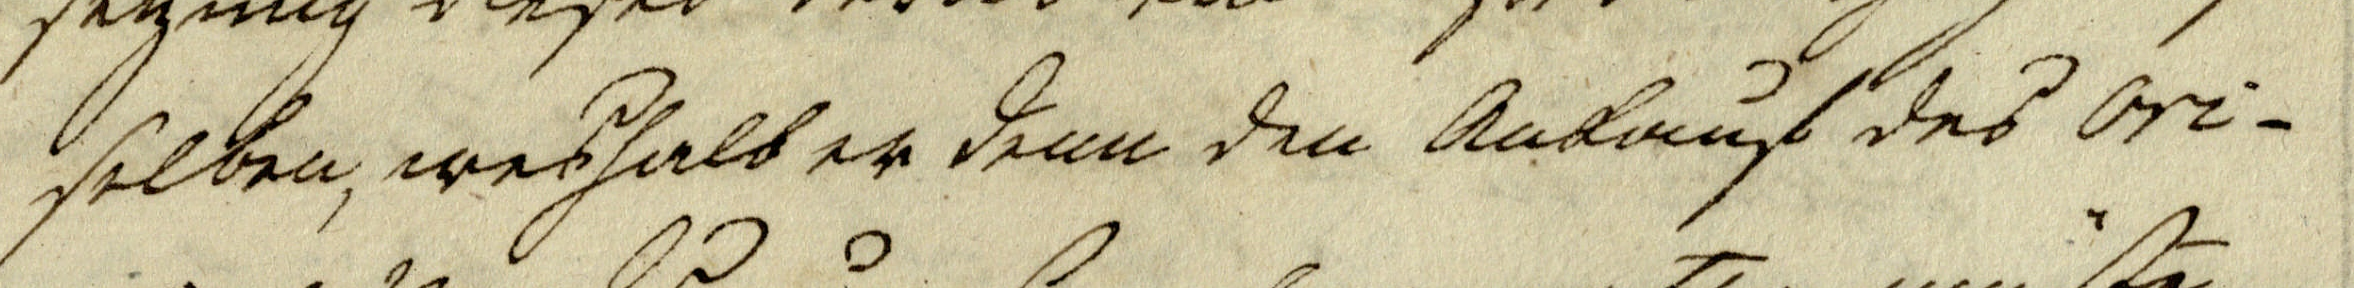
selben, weshalb er denn den Ankauf des Ori¬
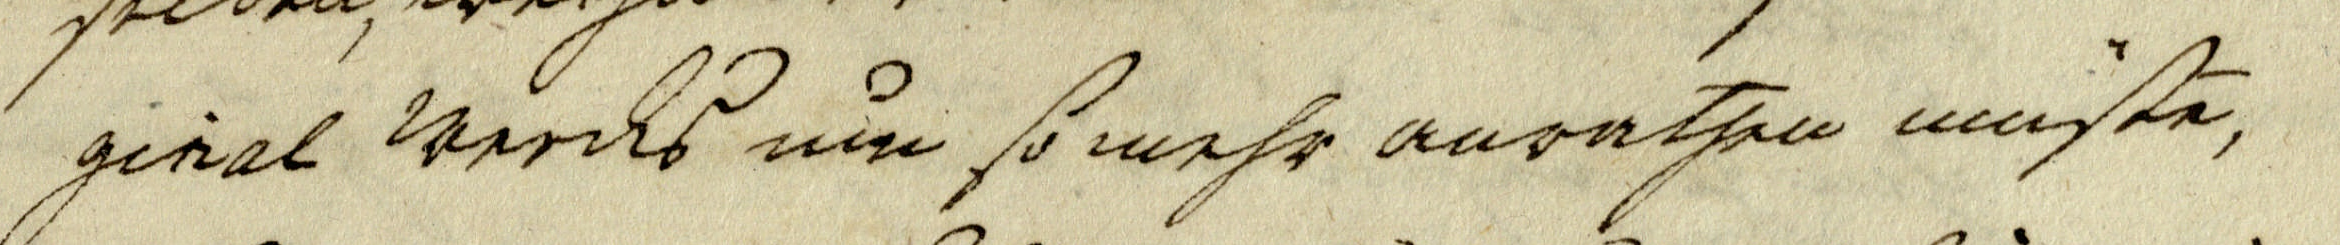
ginal Wercks um so mehr anrathen müßte,
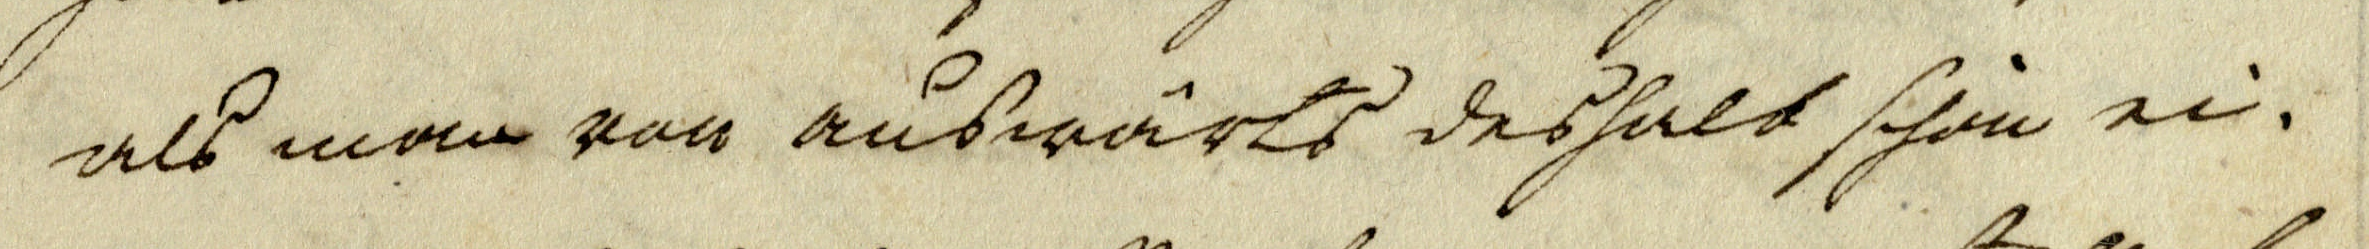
als man von auswärts deshalb schon ei¬
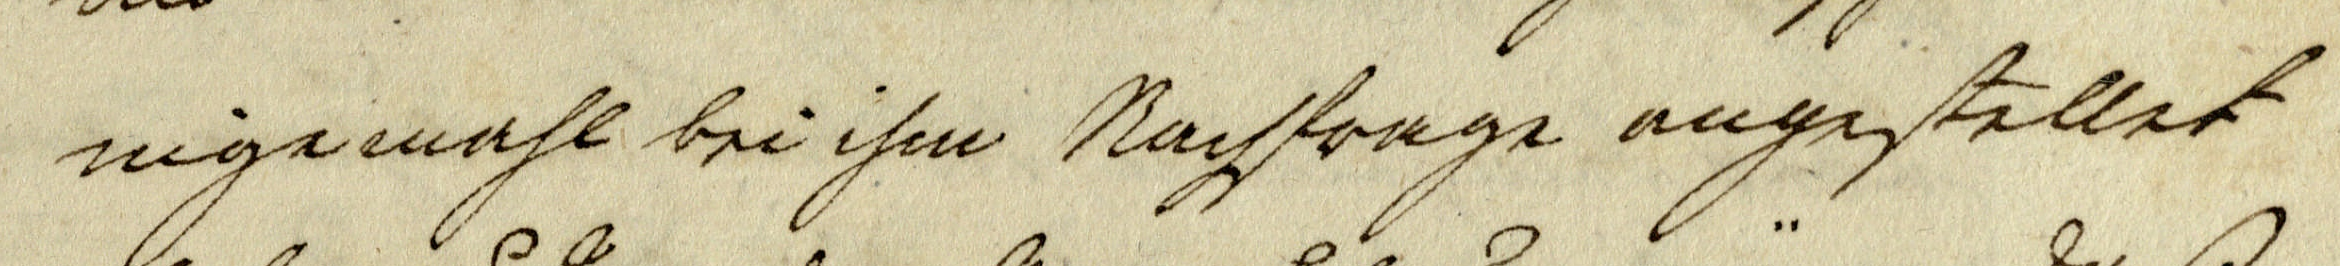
nigemahl bei ihm Nachfrage angestellet
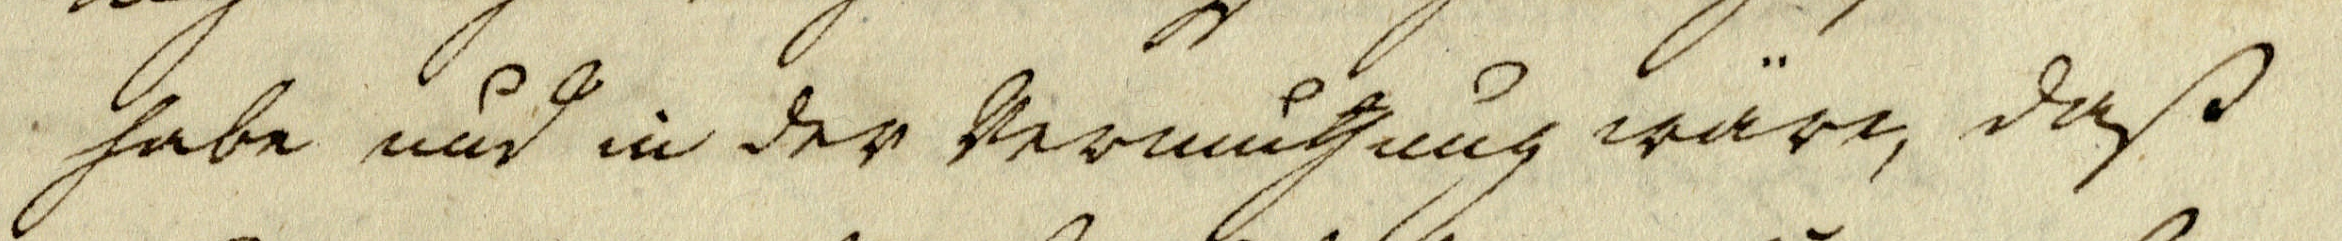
habe und in der Vermuthung wäre, daß
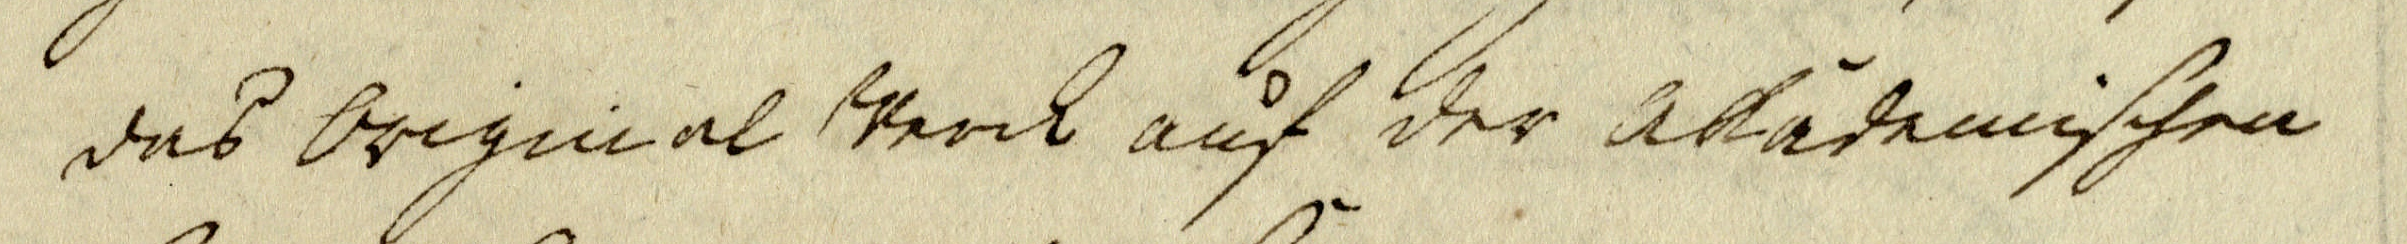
das Original Werck auf der Akademischen
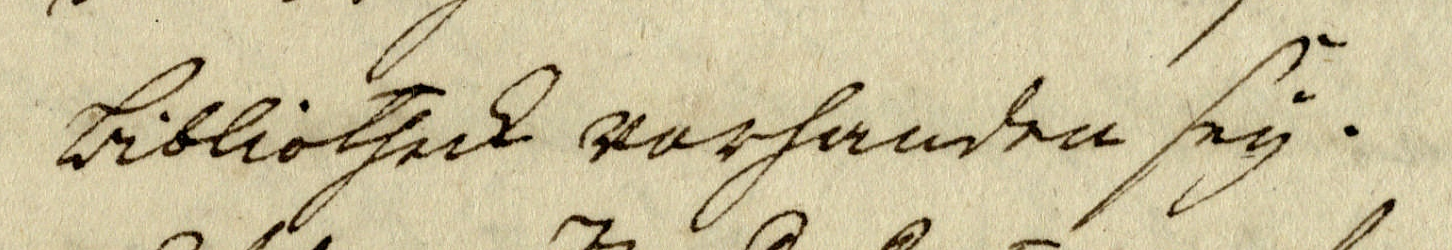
Bibliotheck vorhanden seÿ.
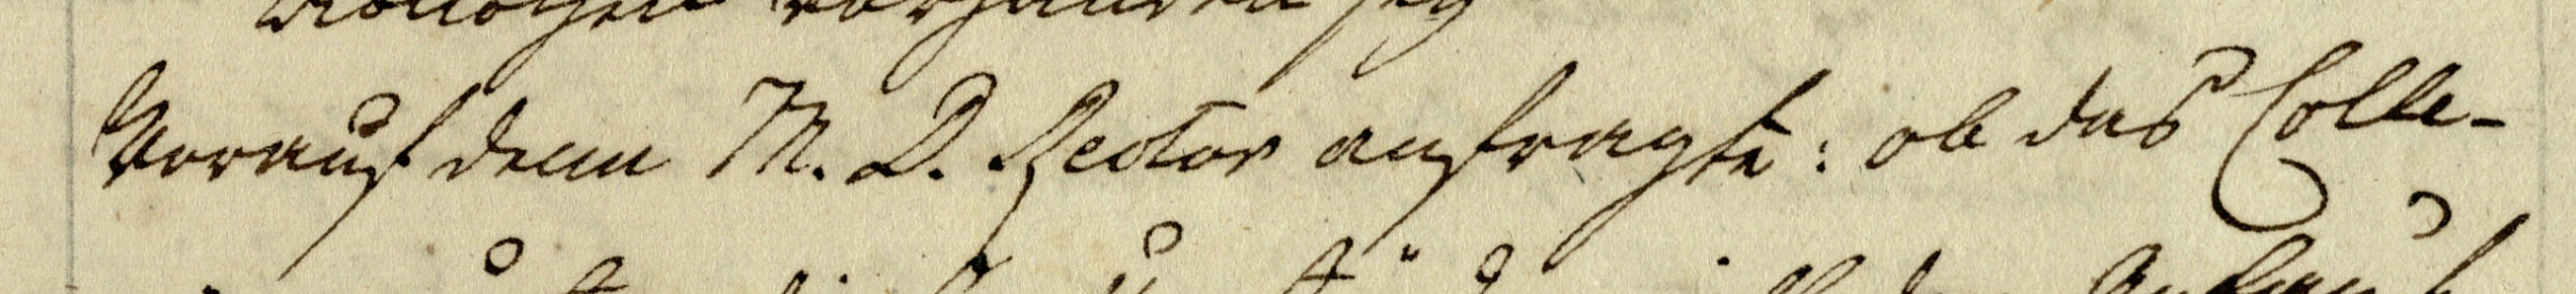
Worauf denn M. D. Rector anfragte: ob das Colle¬
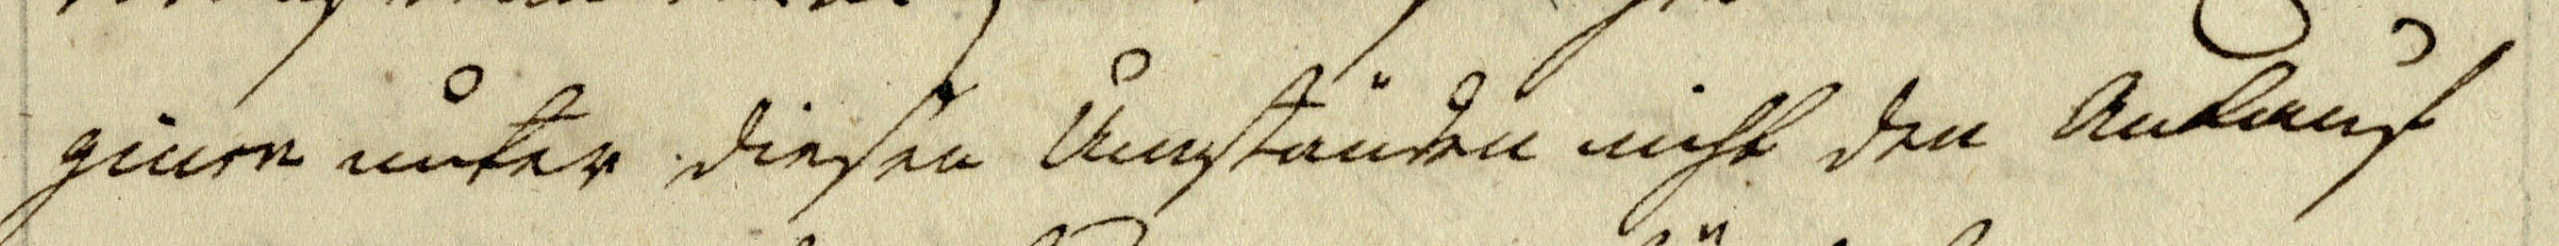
gium unter diesen Umständen nicht den Ankauf
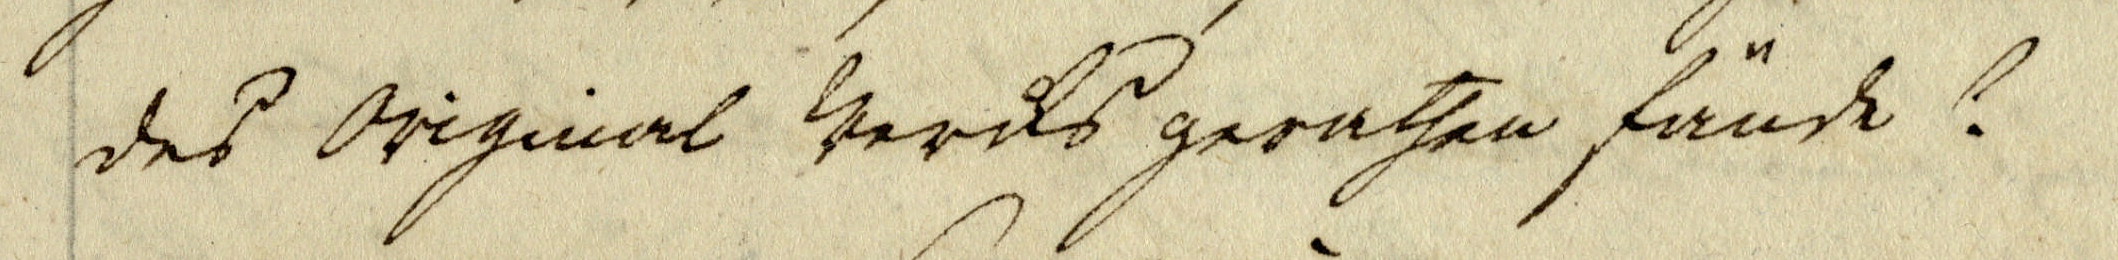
des Original Wercks gerathen fände?
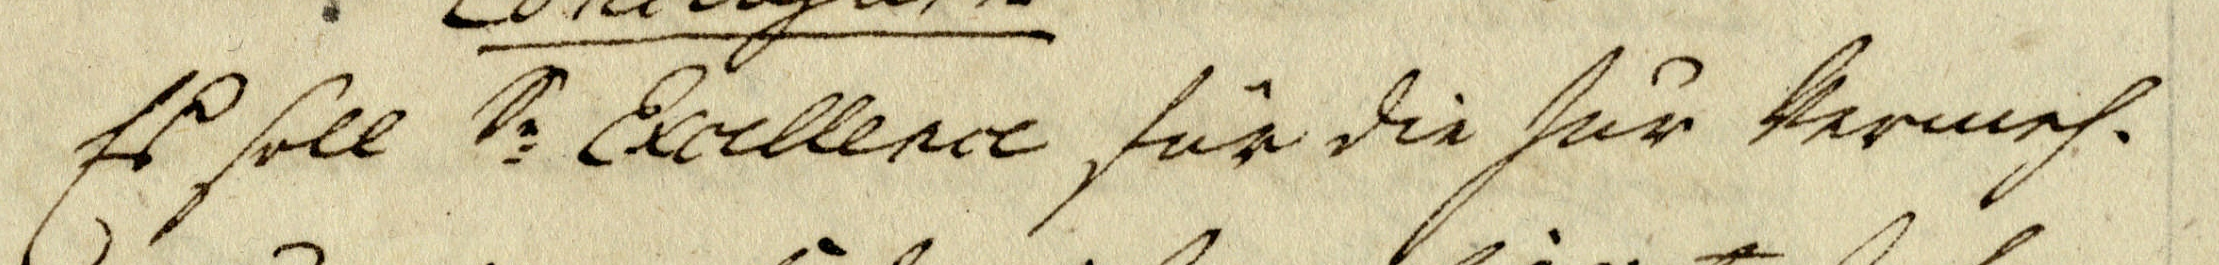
Es soll Sr. Excellence für die zur Vermeh¬
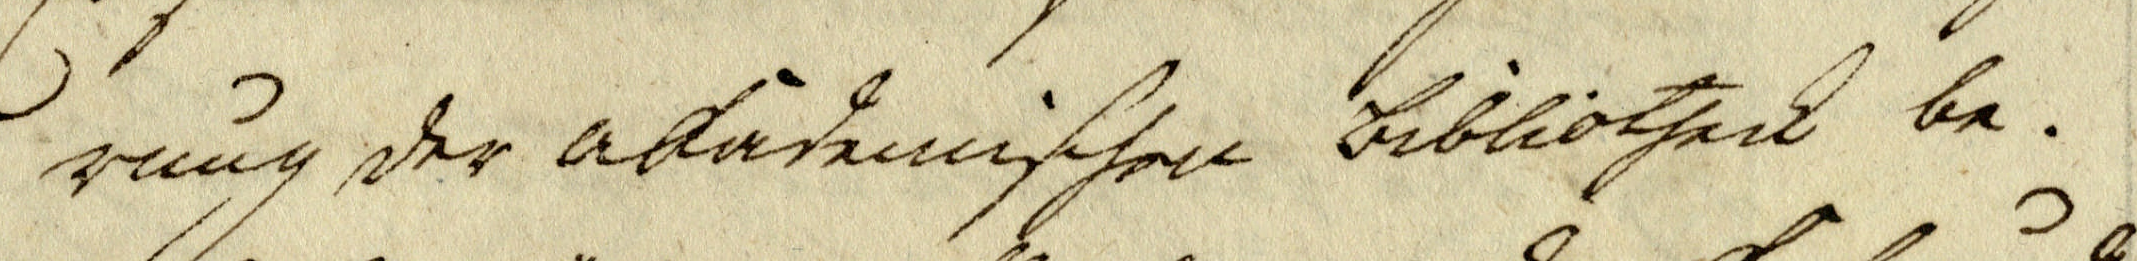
rung der akademischen Bibliotheck be¬
